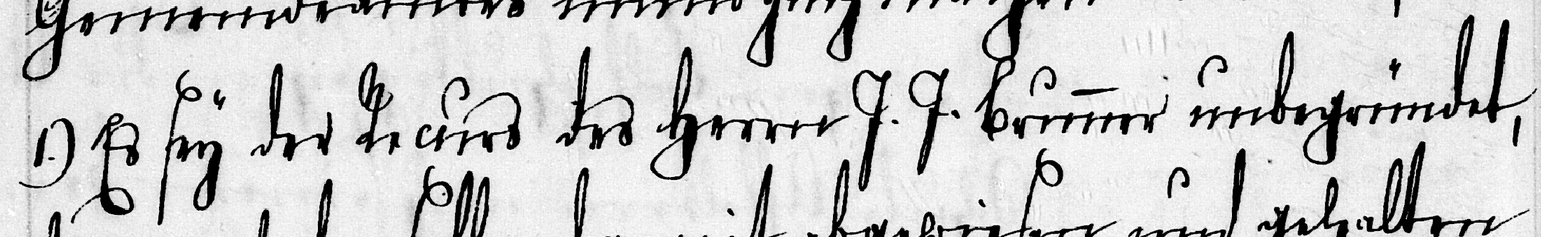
1.) Es sey der Recurs des Herrn J. J. Brunner unbegründet,
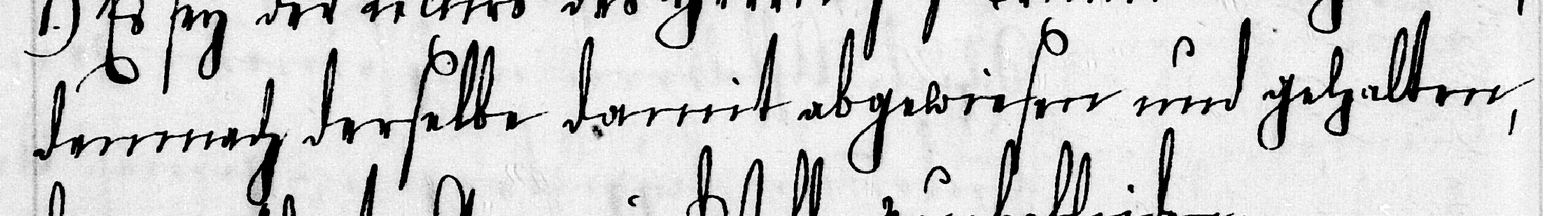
demnach derselbe damit abgewiesen und gehalten,
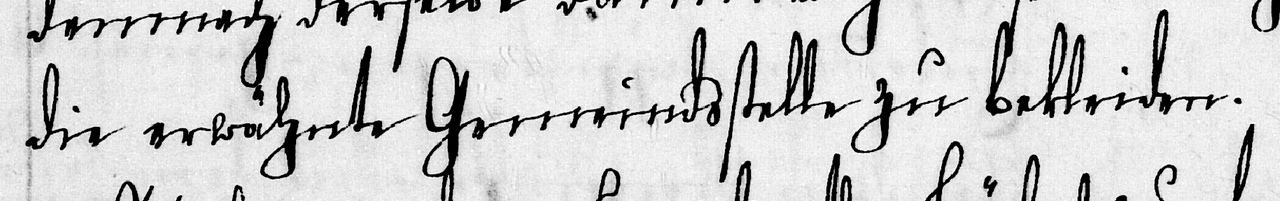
die erwähnte Gemeindsstelle zu bekleiden.
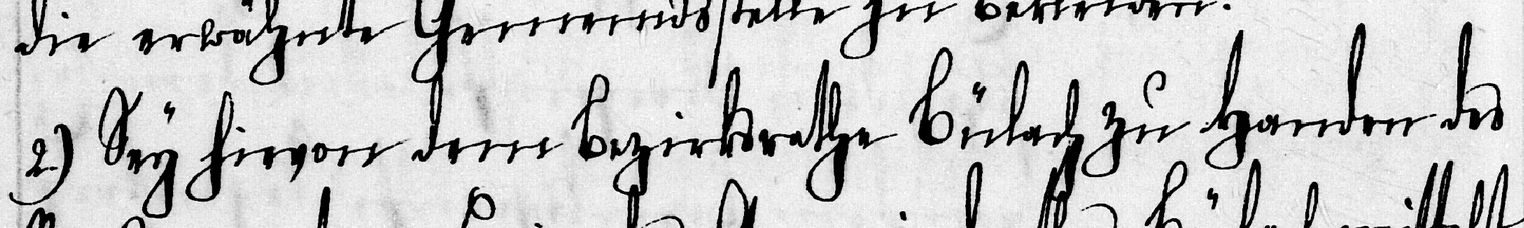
2.) Sey hievon dem Bezirksrathe Bülach zu Handen des
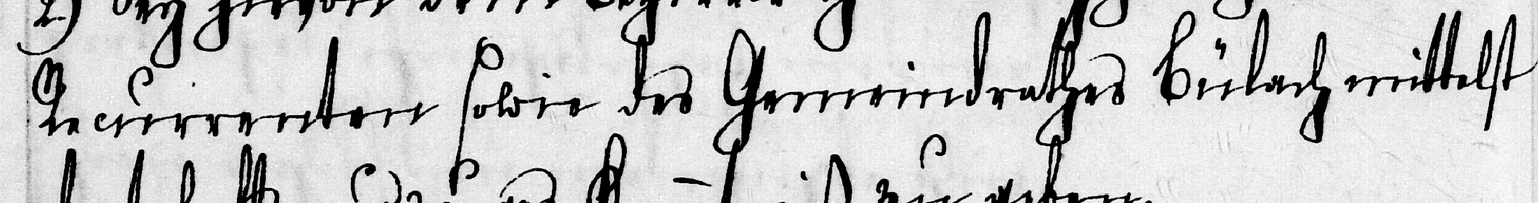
Recurrenten sowie des Gemeindrathes Bülach mittelst
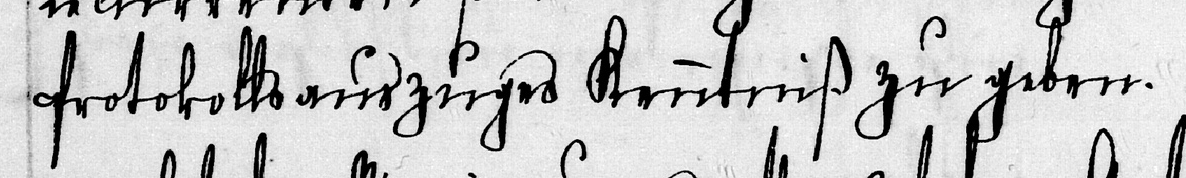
Protokollsauszuges Kenntniß zu geben.
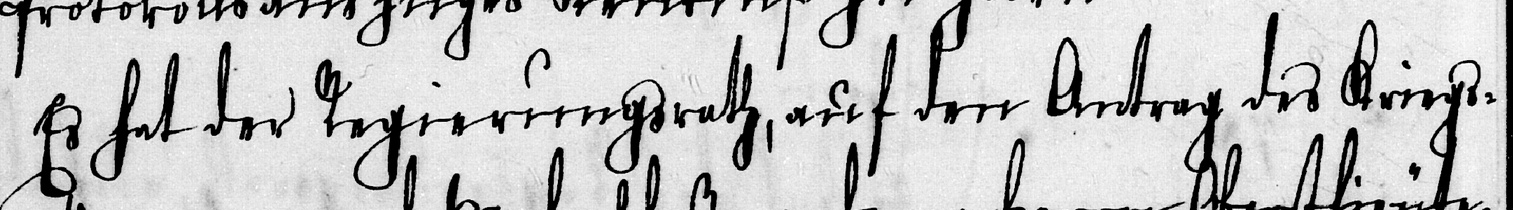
Es hat der Regierungsrath, auf den Antrag des Kriegs¬
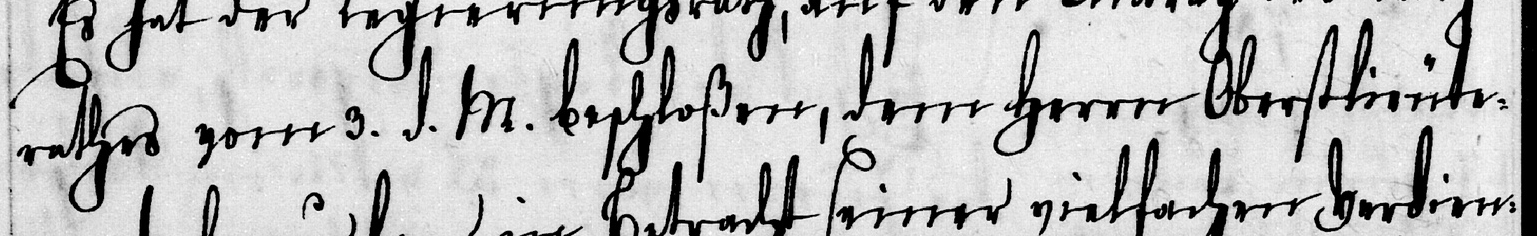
rathes vom 3. d. M. beschloßen, dem Herrn Oberstlieute¬
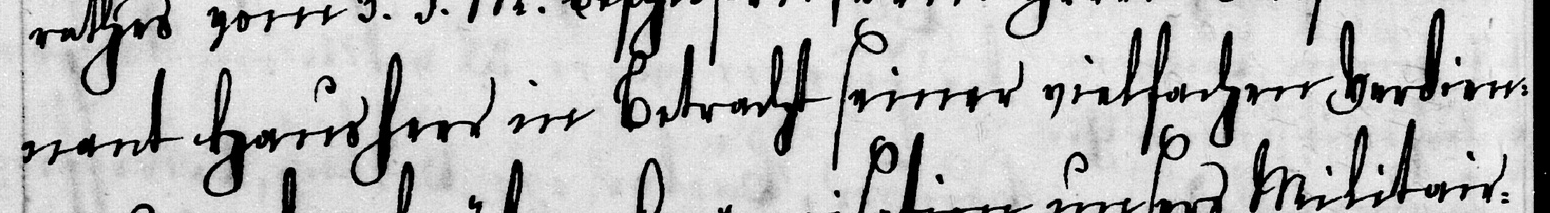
nant Hausheer in Betracht seiner vielfachen Verdien¬
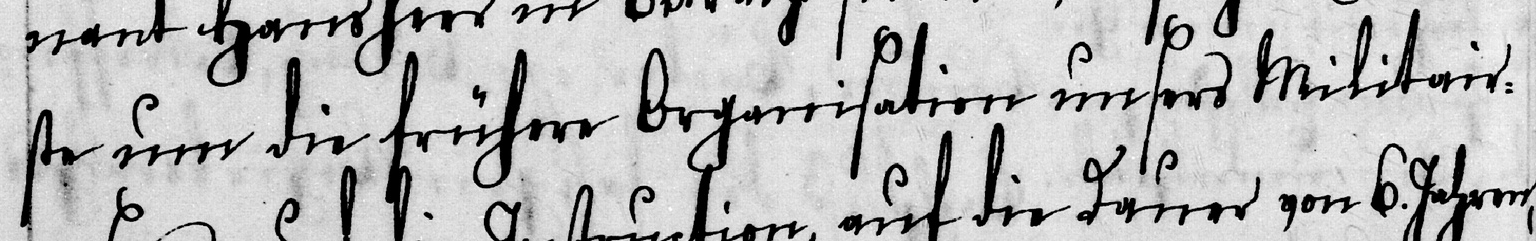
ste um die frühere Organisation unsers Militair¬
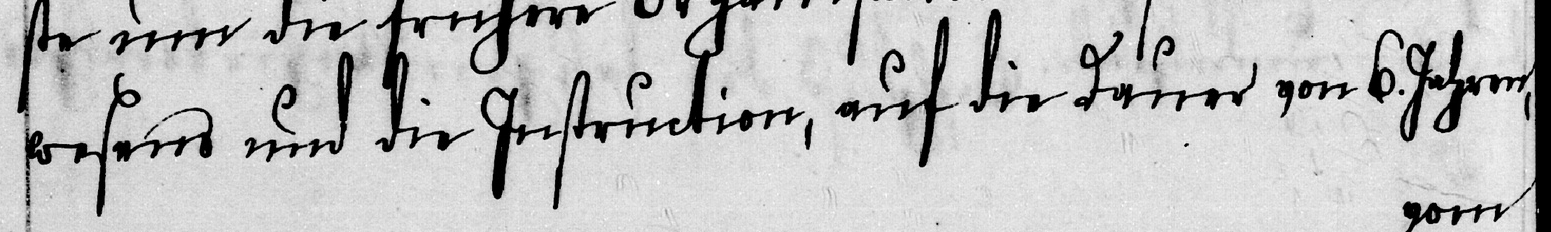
wesens und die Instruction, auf die Dauer von 6. Jahr¬
